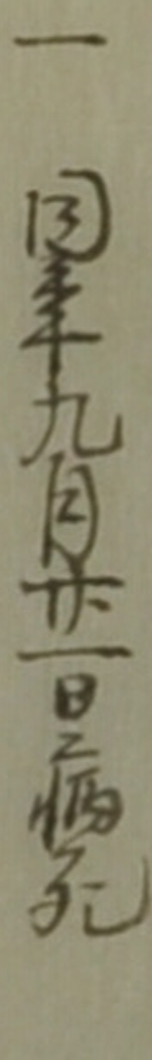一同年九月廿一日病死
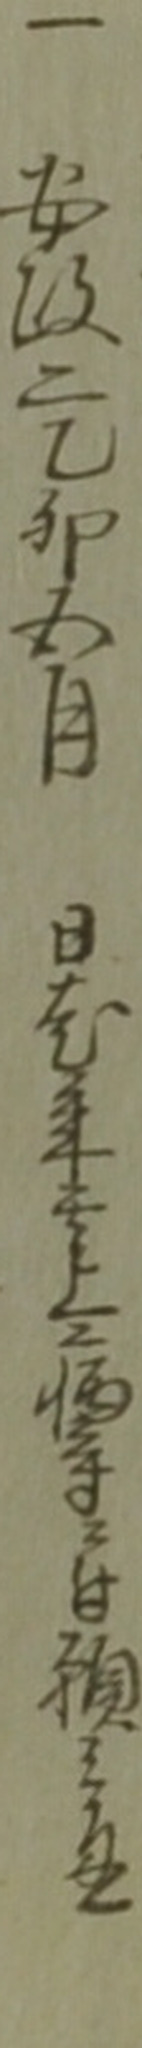一安政二乙卯五月日老年其上病気ニ付願之通
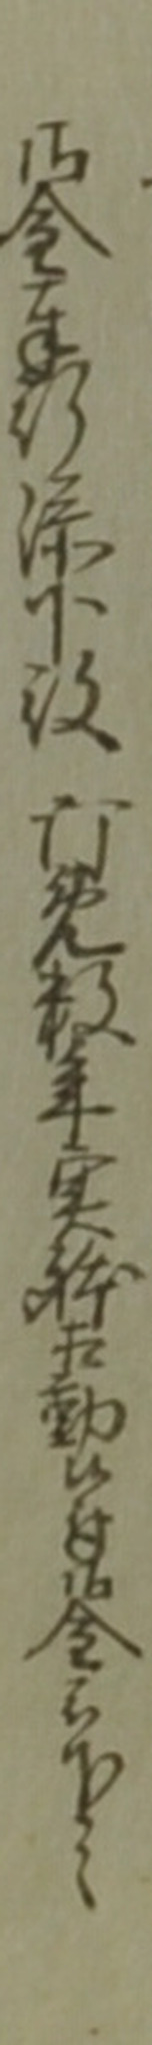御金奉行添下役御免数年実躰御勤候付金被下之

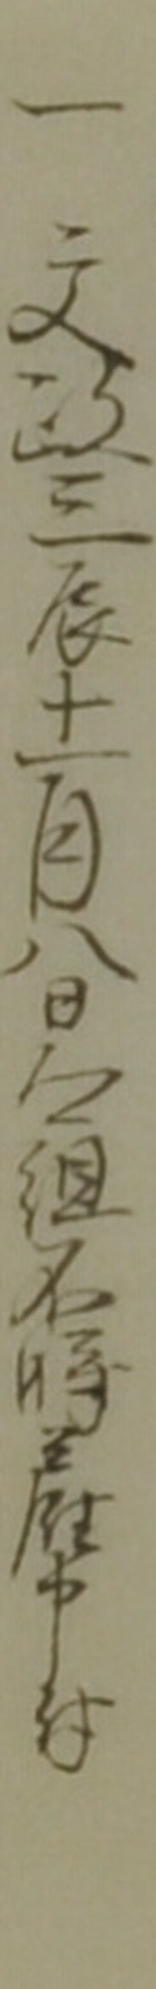一文政三辰十一月八日郷組不時雇申付
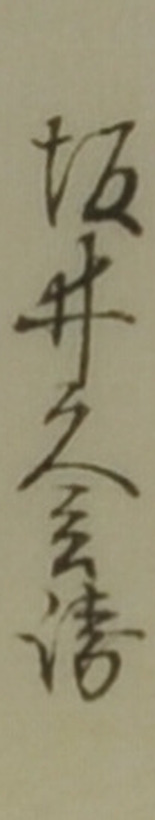坂井久兵衛
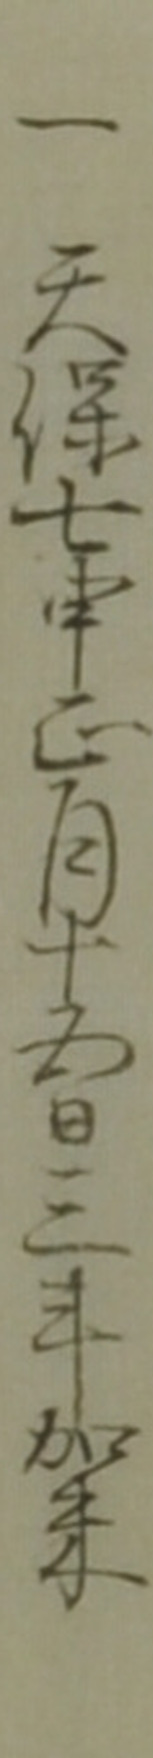一天保七申正月十五日三斗加米
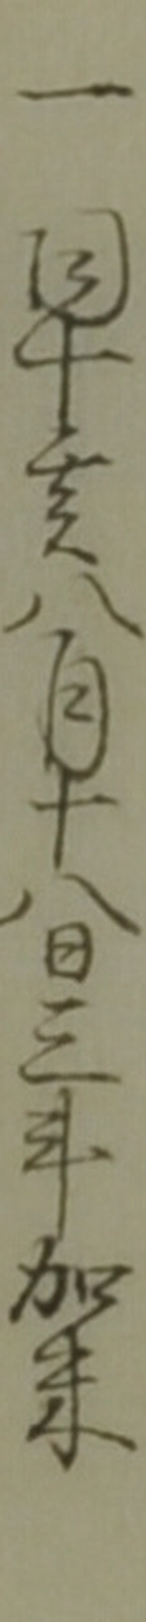一同十亥八月十八日三斗加米
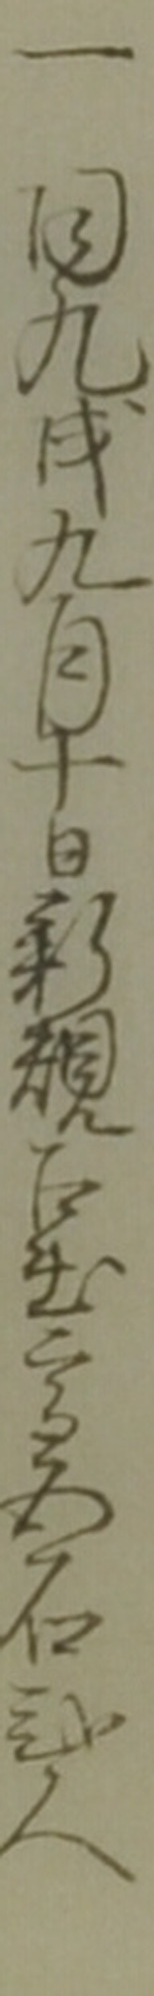一同九戌九月十日新規召出高五石弐人
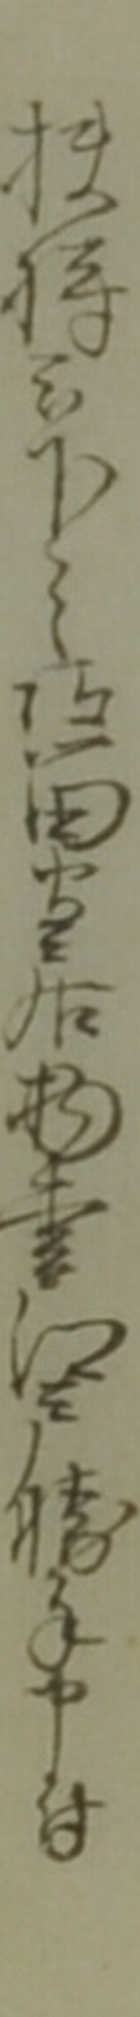扶持被下之御留守居物書江戸勝手申付
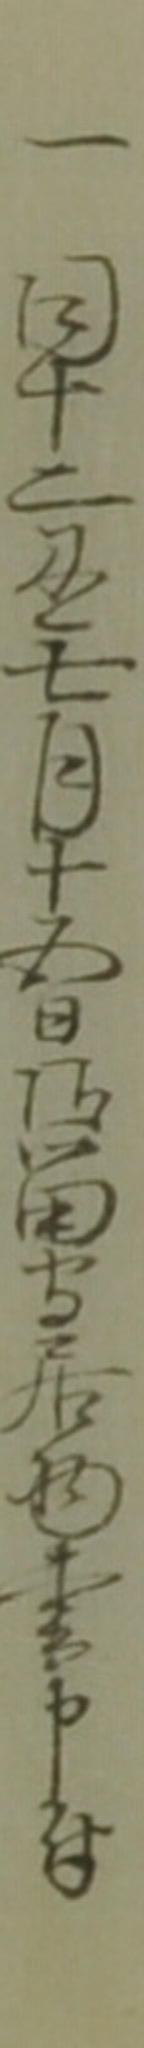一同十二丑七月十五日御留守居物書申付
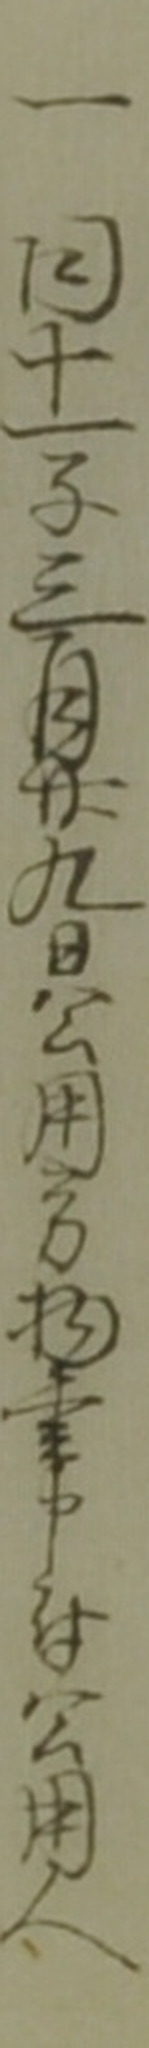一同十一子三月廿九日公用方物書申付公用人
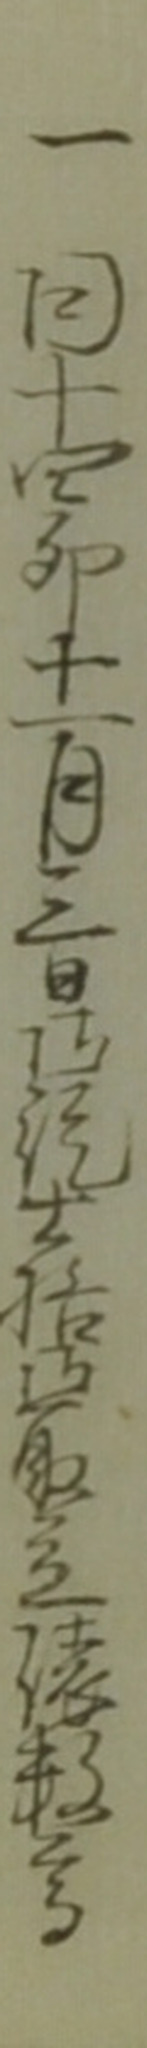一同十四卯十一月三日御徒士格御取立俵数高
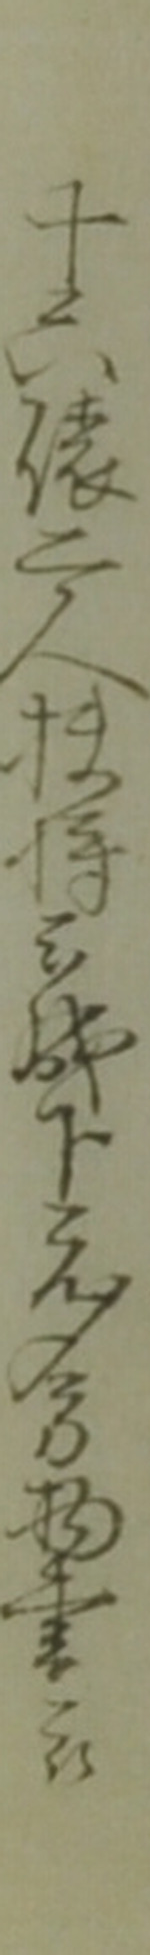十六俵二人扶持被成下元〆物書被
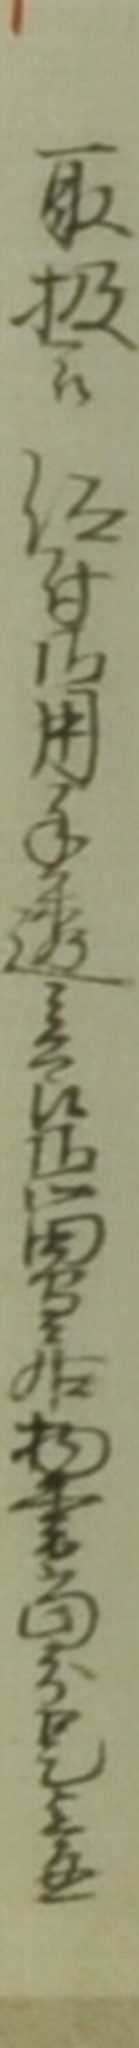取扱被仰付御用手透之節御留守居物書当分是迄通
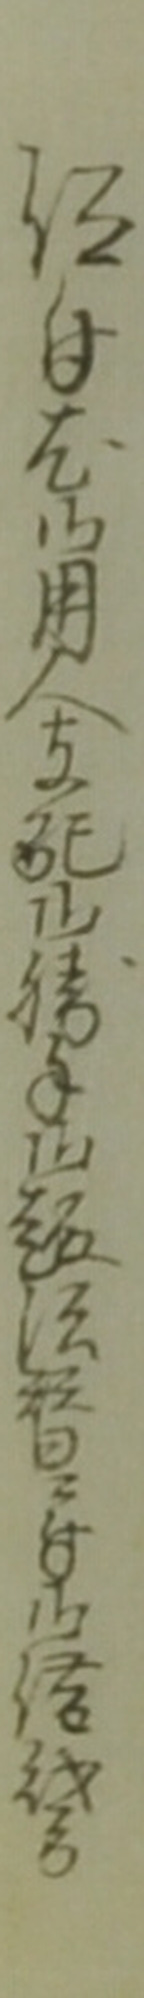仰付尤御用人支配御勝手御趣法替ニ付御借財方

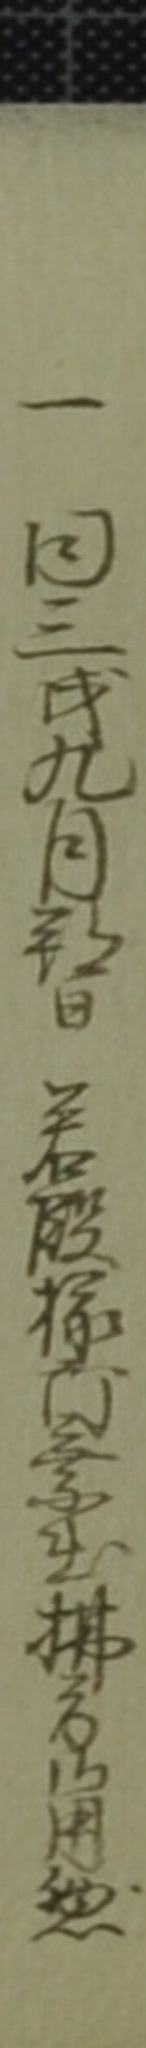一同三戌九月朔日若殿様御乗出払方御用惣
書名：無足諸士勤仕録（八）
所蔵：伊那市立高遠町図書館・合同会社AMANE
